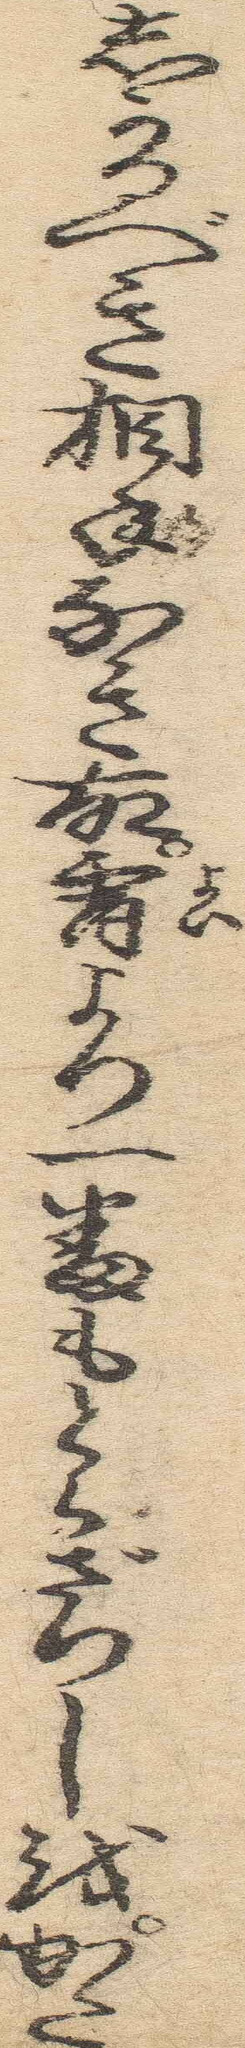しかるべき相手なき故宵より一番もとらざりしを。かた
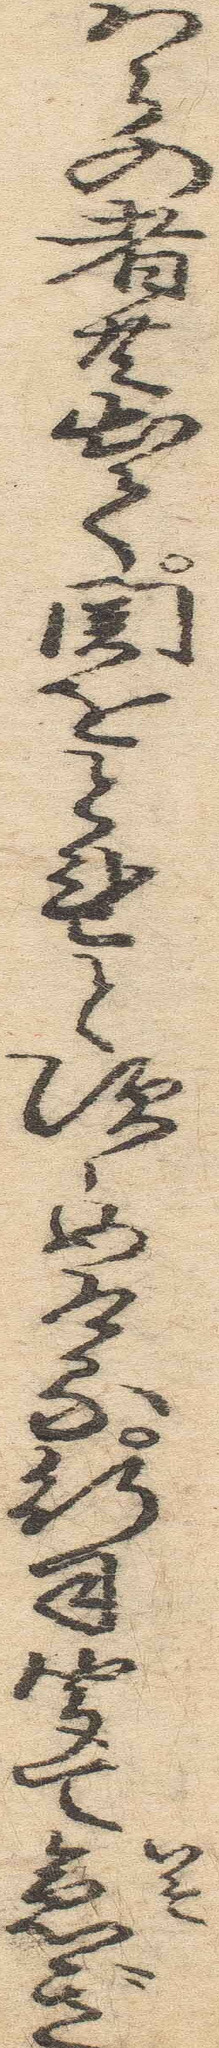はらの者共出て。関をとられと次ゝめける。行司聞て急ぎ
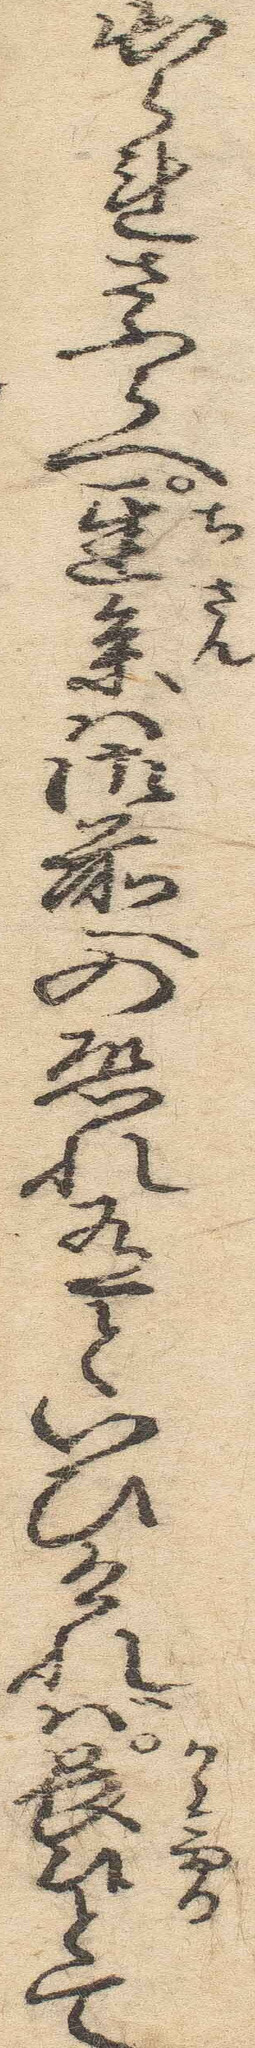出られさうらへ。遅参は御前への恐れ有やといひければ畏候とて
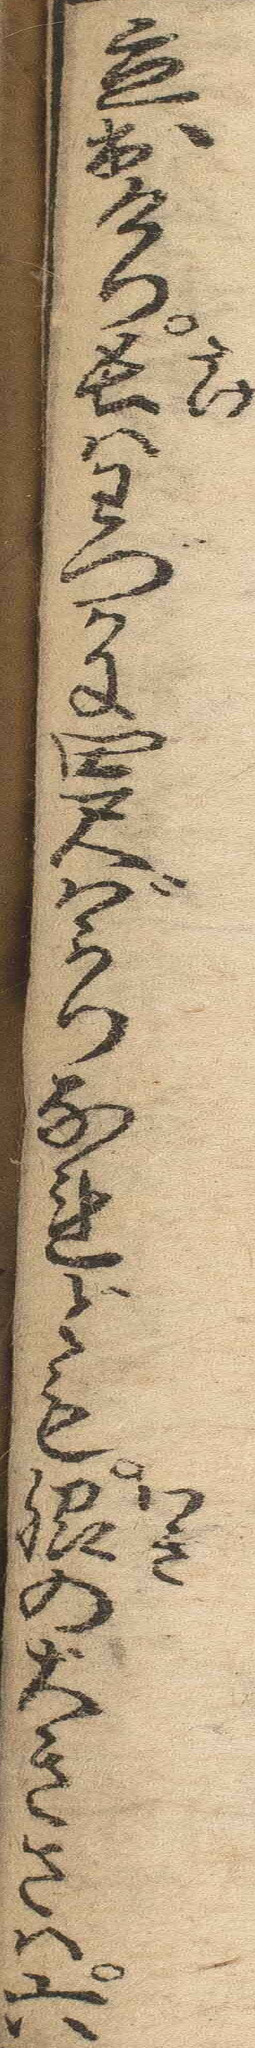立出けり。長はわづかに四尺ばかりなれども脇の大さは六
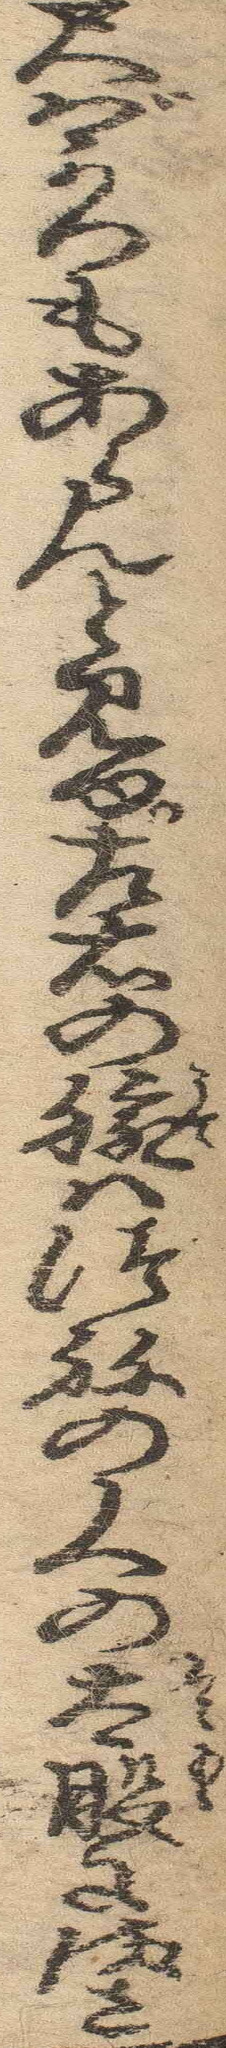尺ばかりもあらんと見ゆ。左右の腕はつねの人の太股にまさ
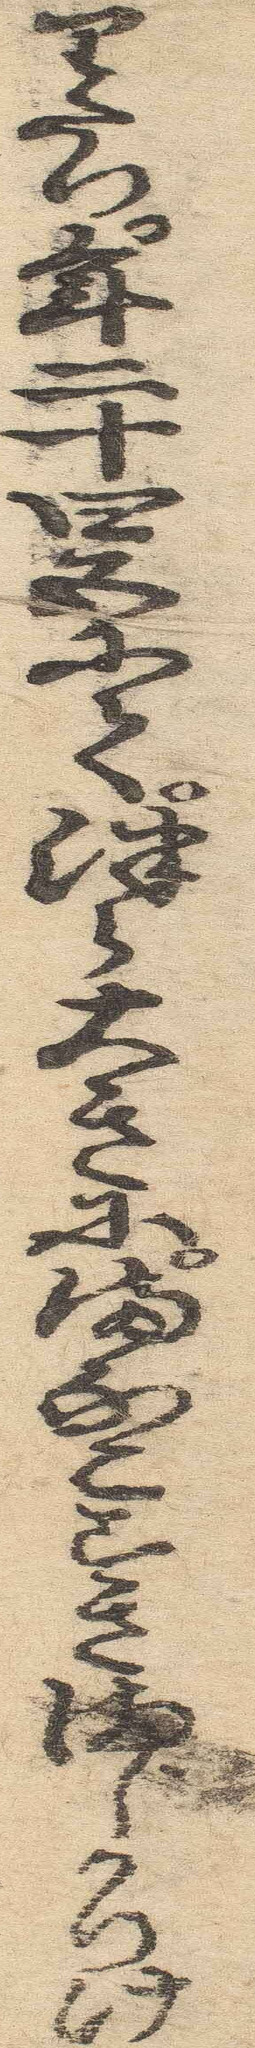りたり。年二十四五にて。つら大きに。まなこすさまじかりけ
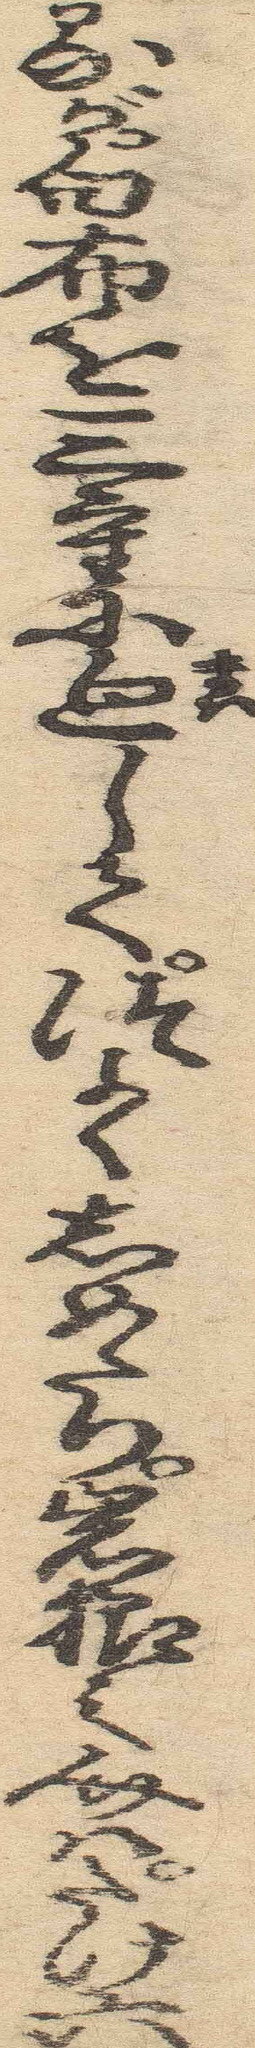るが。白布を三重に廻してつよくしめたり。岩根之介はたけ六
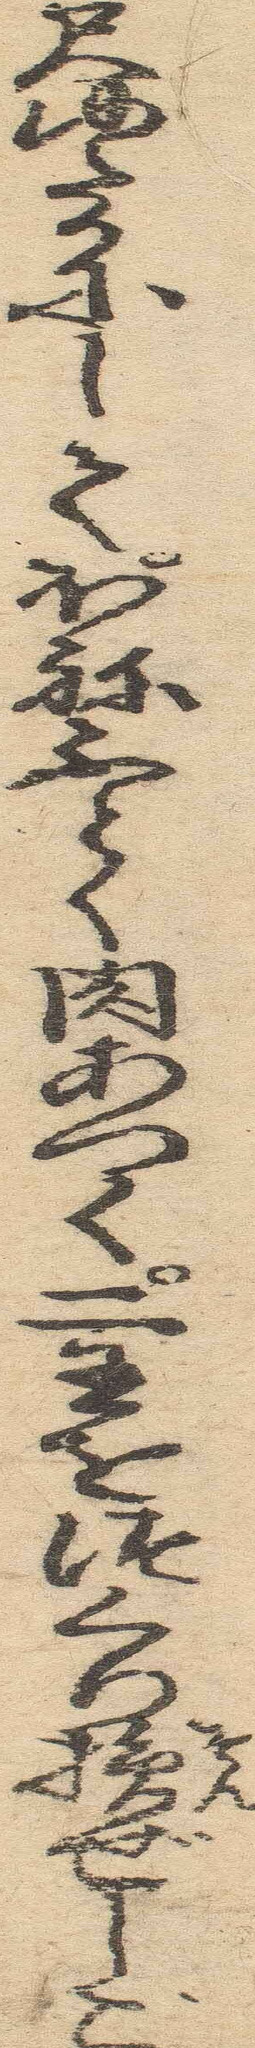尺ゆたかにして。ほねふとく肉あつく。二重をつくり損ぜしご
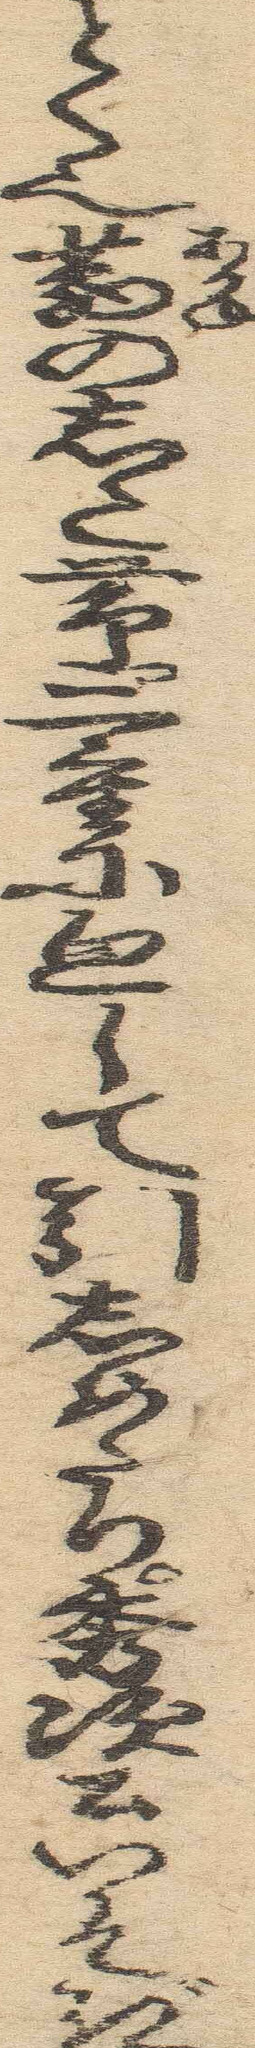とく也茜のした帯。二重に廻して引しめたり。秀次公いそぎ
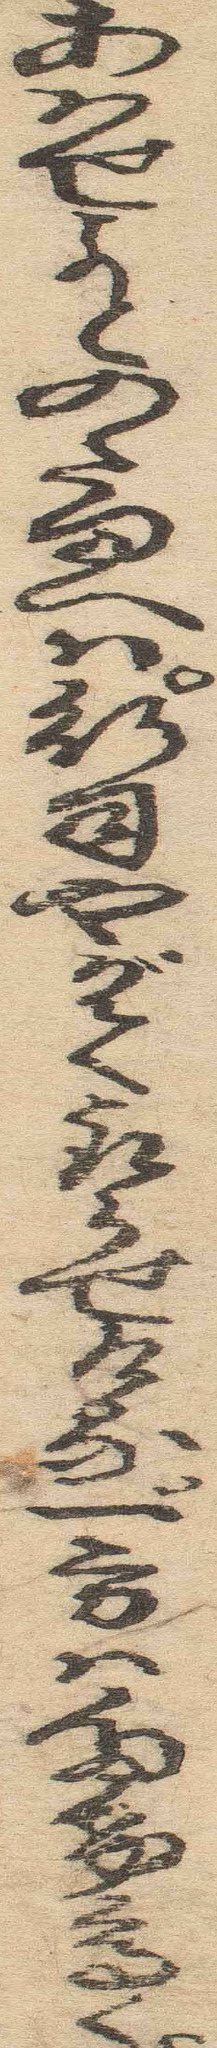あはせよとのたまへは。行司やがて取らせける。一方はたけ髙く。
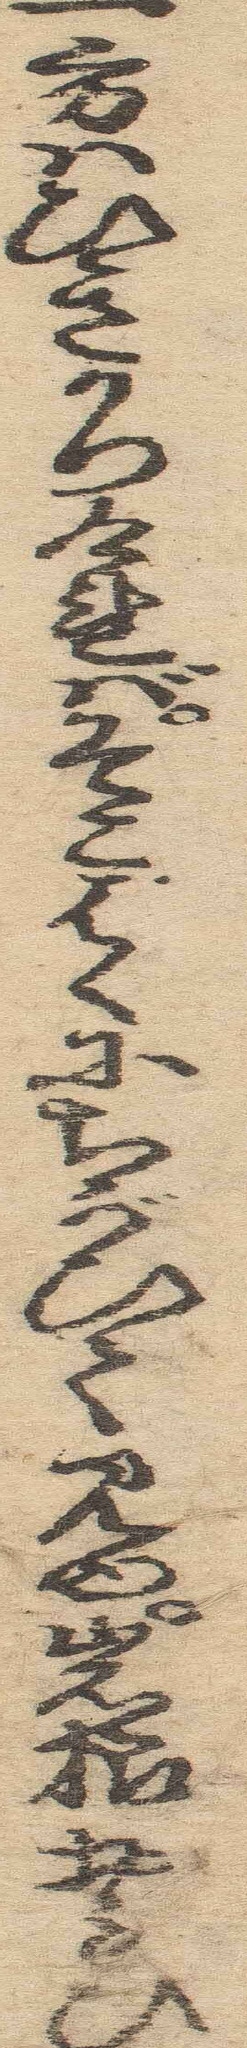一方はひきかりければ。そこばくにちがひて見ゆ。岩根おもひ
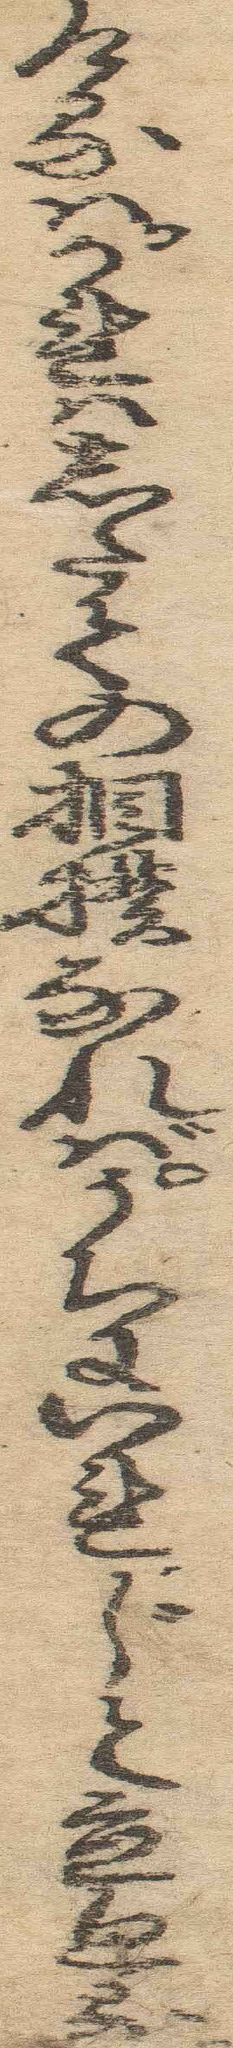けるは。したての相撲なれば。うちにいれじと立廻る。
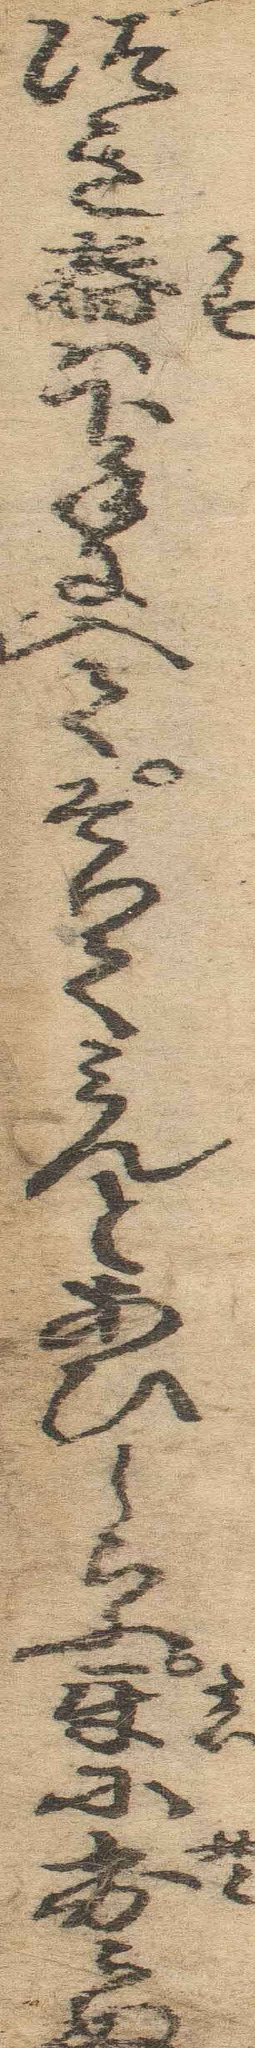つき舂は下手に入て。そつてみんとあひしらふ。互に劣らぬ

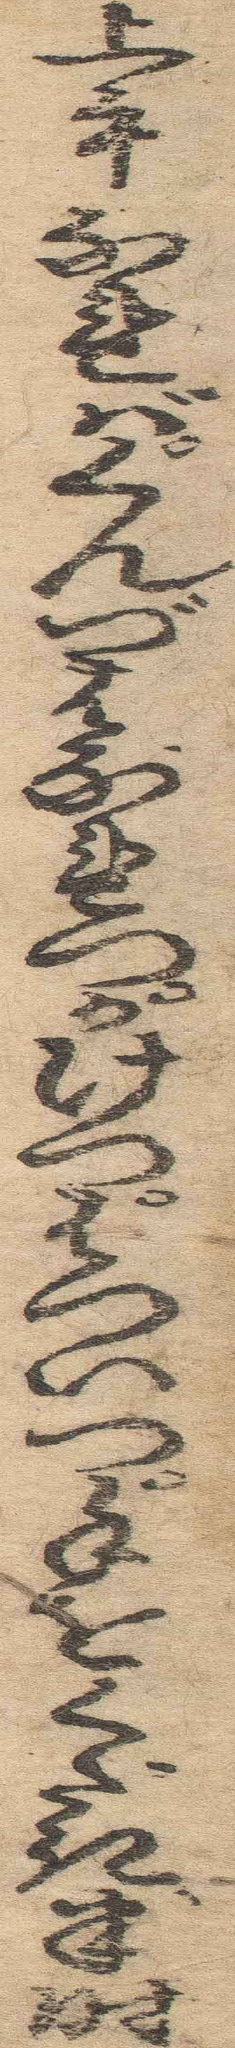上手なれば。くんづはなれつ。かけつ。はついつ。手をくだき半時
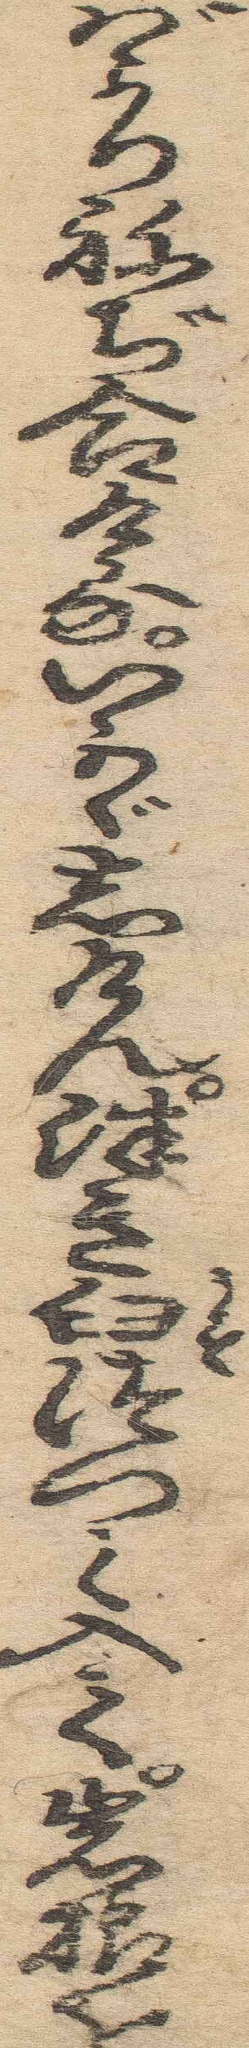ばかりねぢ合ける。いかゞしけん。つき臼つつと入て。岩根を
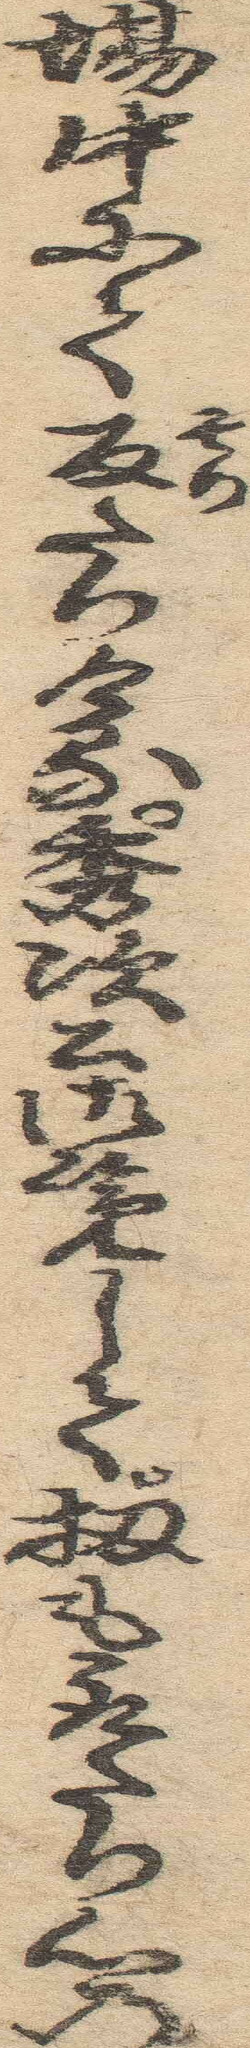場中にて反たりける。秀次公御覧して。扨も取たり心の
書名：古今相撲大全
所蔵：東京学芸大学附属図書館 国文学研究資料館
